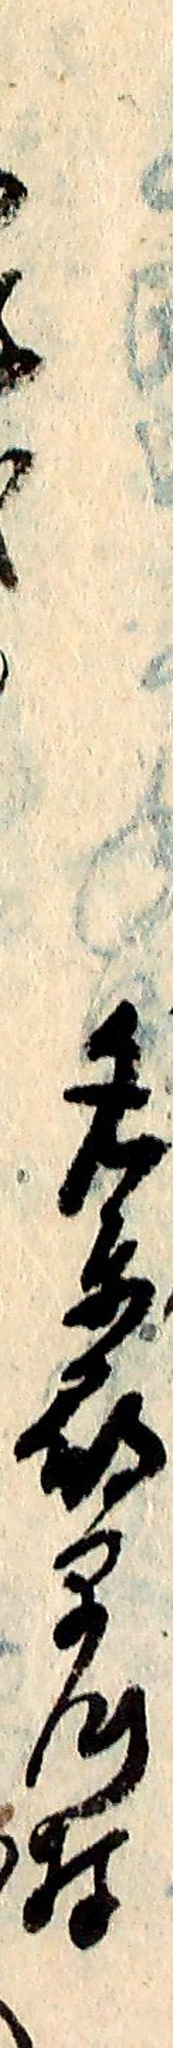名東郡早淵村
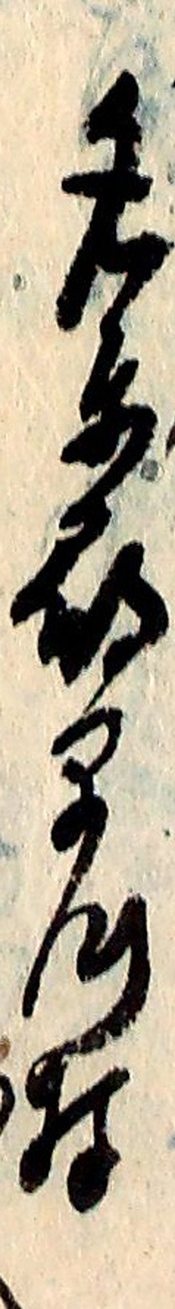名東郡早淵村
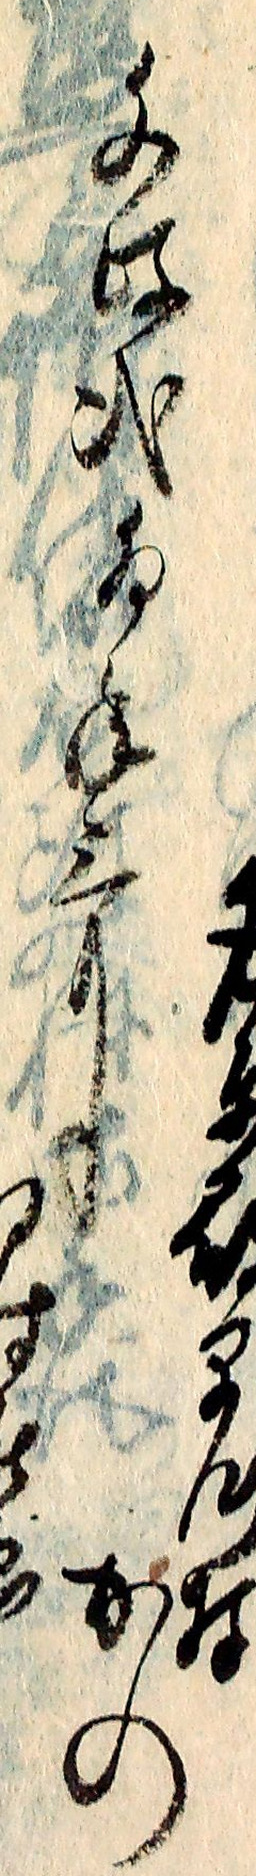文政弐卯年三月かの
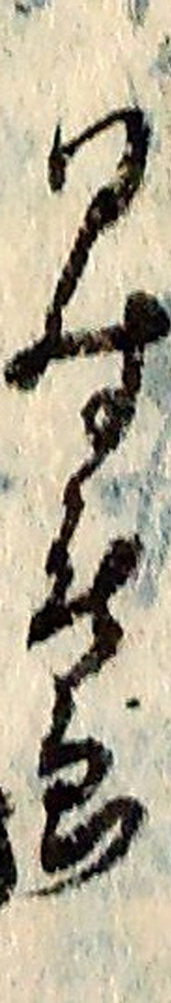同村庄屋
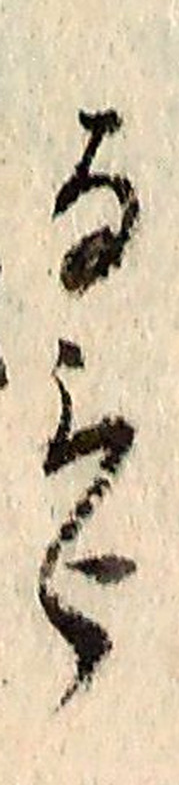与三郎
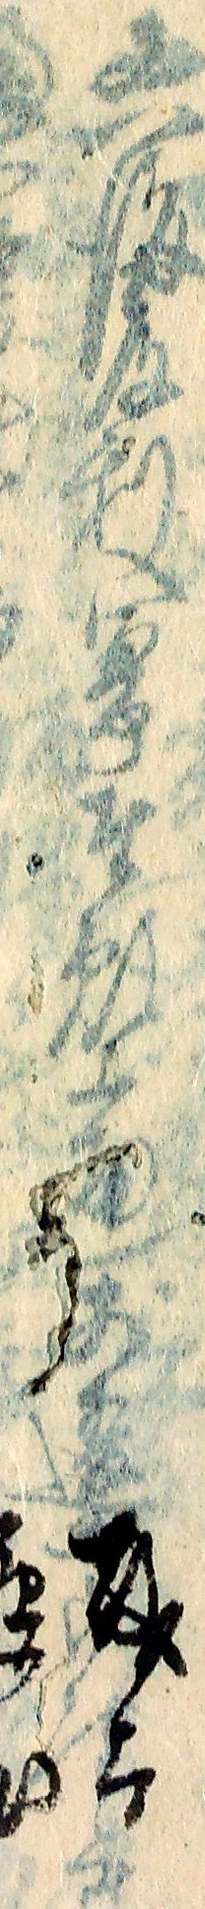同村庄屋
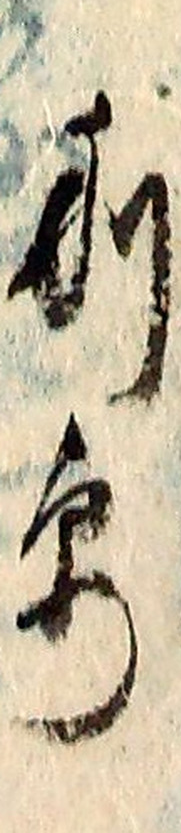利兵衛
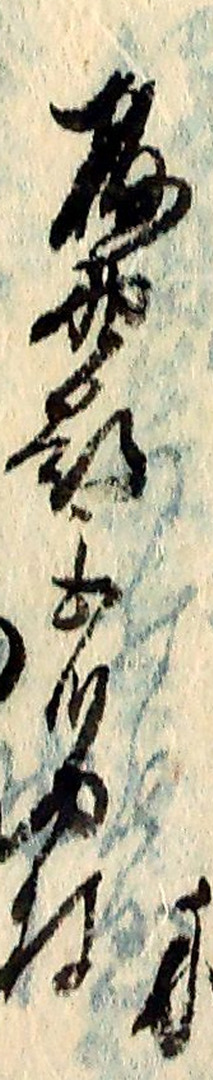板野郡宮川内村
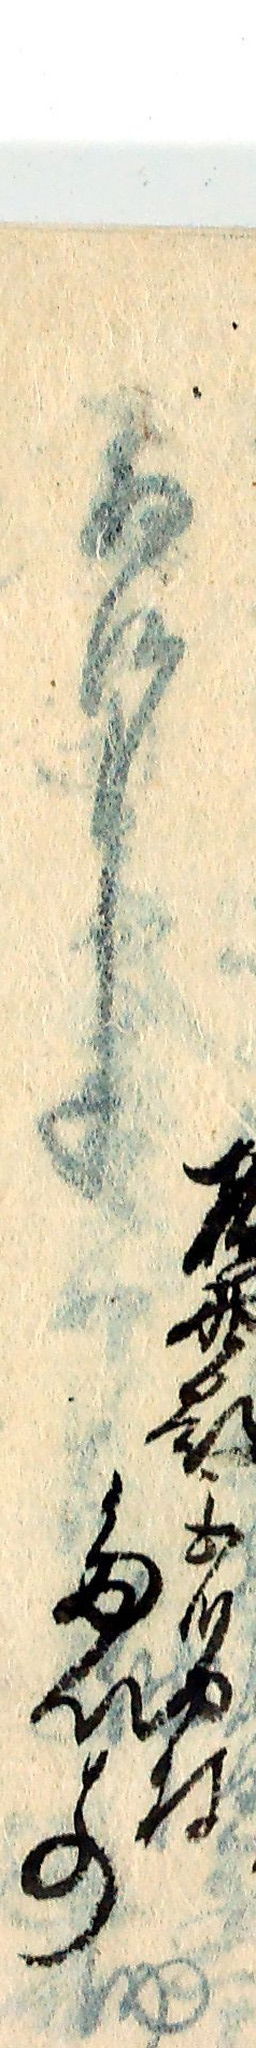たいとの
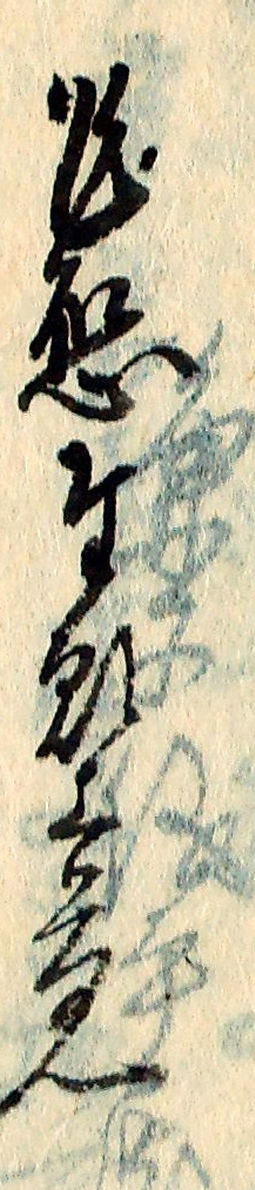乍恐奉願上覚
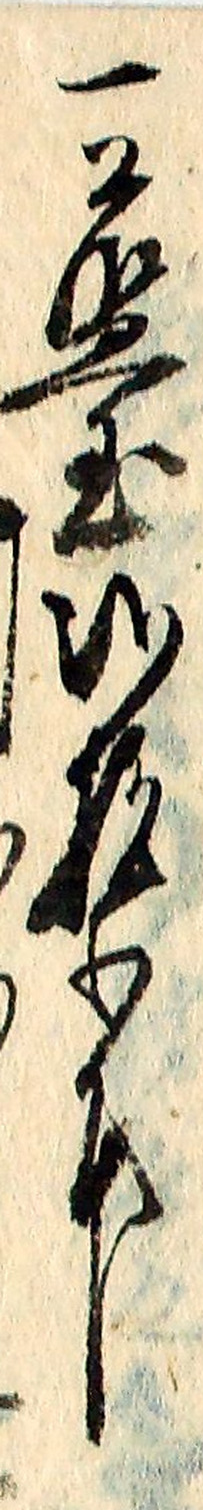一藍玉弐拾五本△
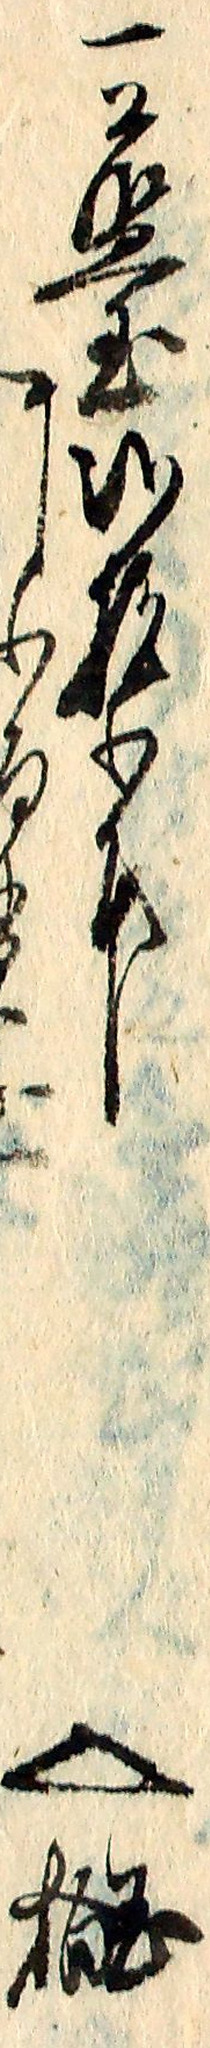一藍玉弐拾五本△
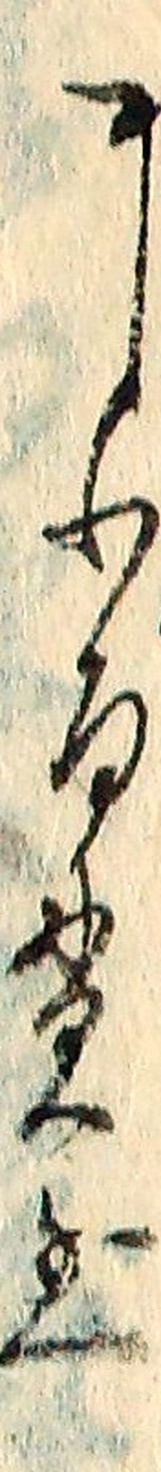正五百貫匁
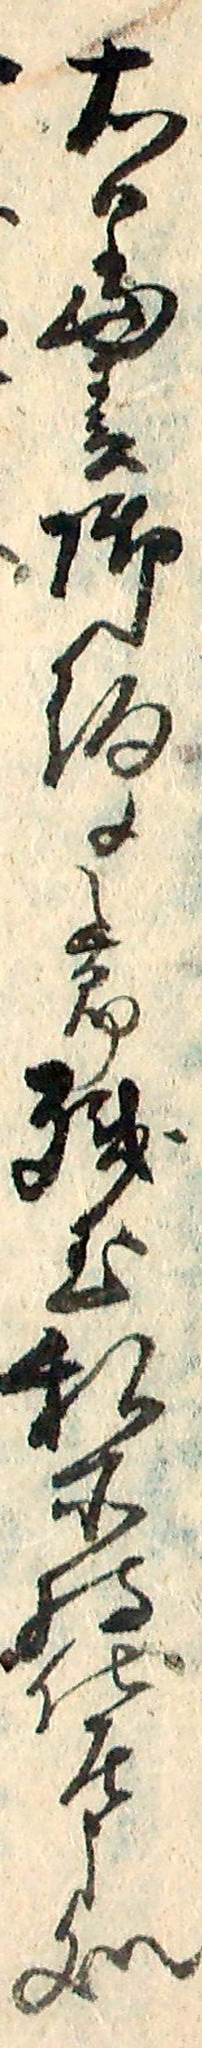右は当春御約め之節残玉私所持仕居申処
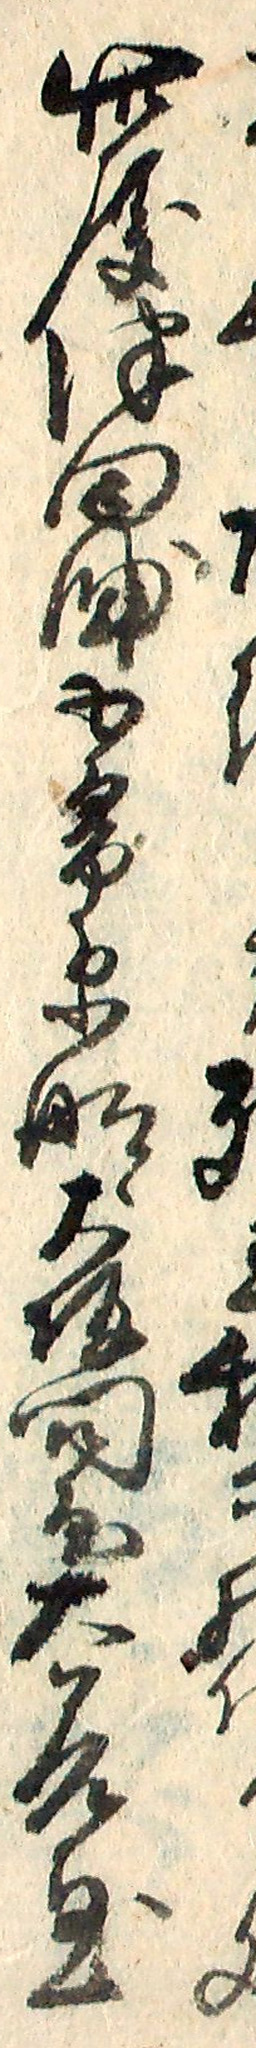此度津田浦五郎兵衛船に大坂問屋大藤屋

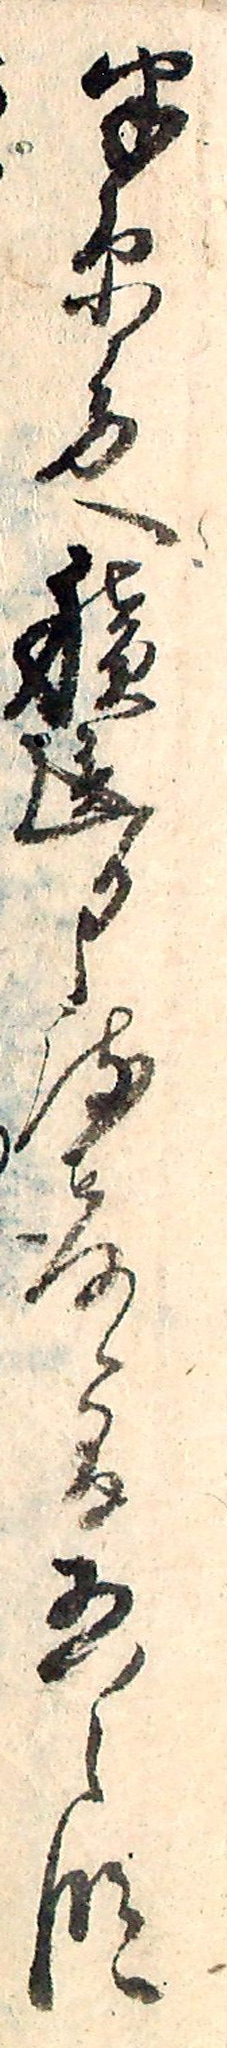半兵衛方へ積送り申度奉存候間右之段
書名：諸御願書控(後藤氏壱番）
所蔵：鳴門教育大学 Naruto University of Education
